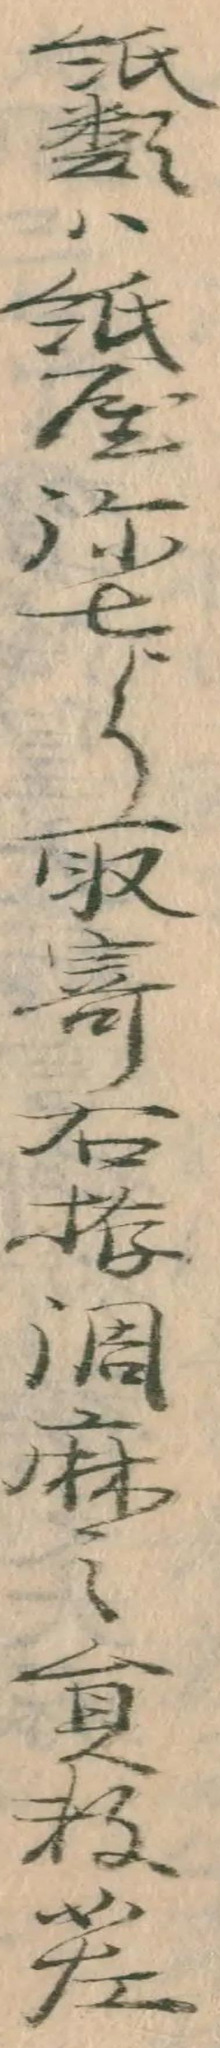紙類ハ紙屋弥七より取寄右拵調麻之員数如左
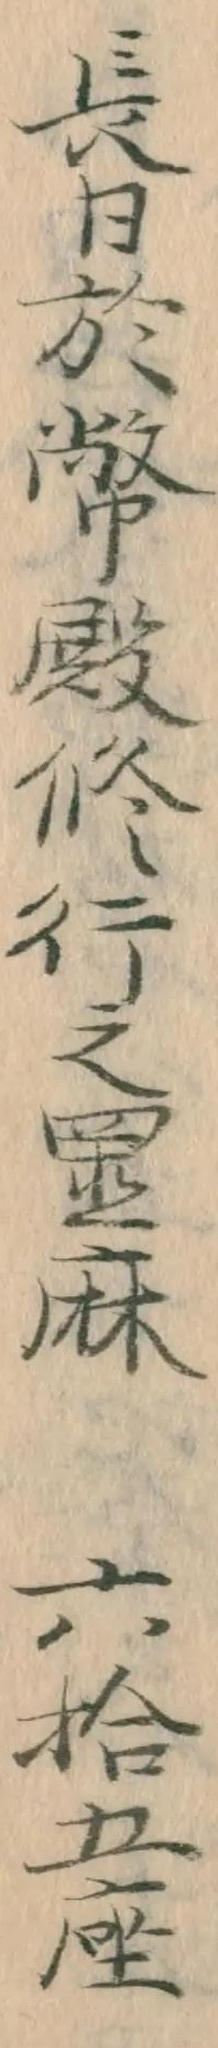長日於幣殿修行之置麻六拾五座
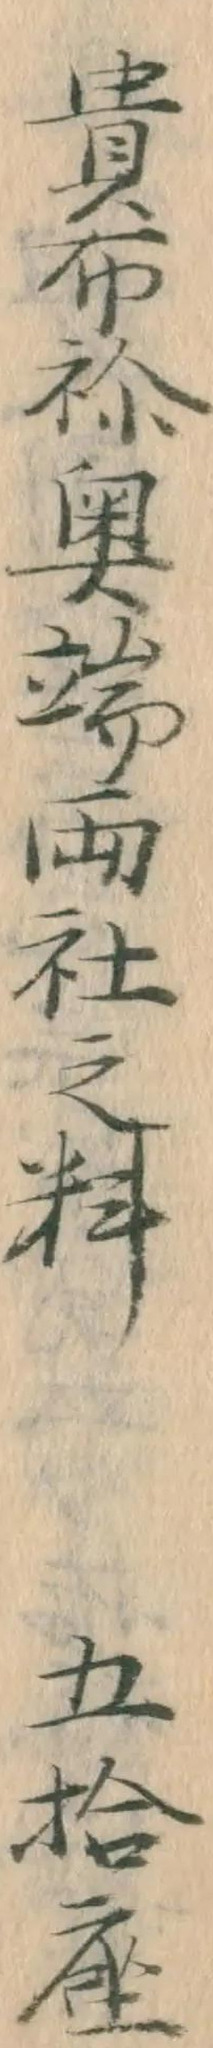貴布祢奥端両社之料五拾座
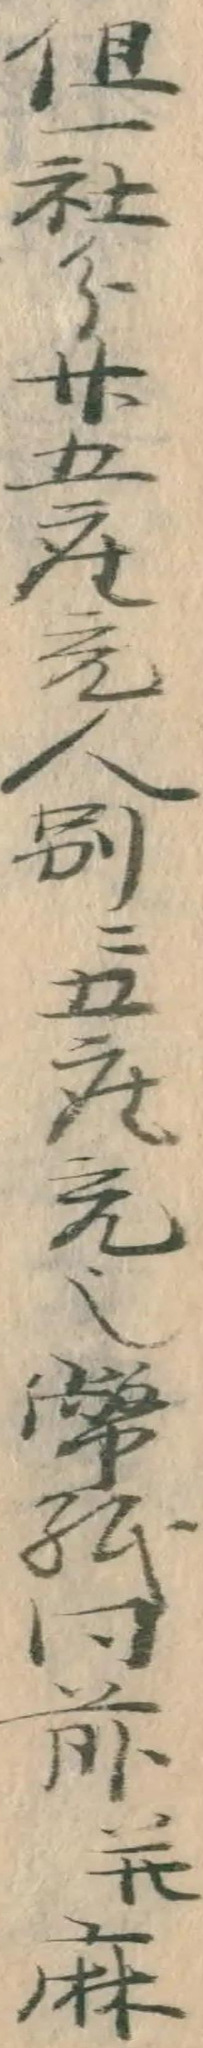但一社分廿五座充人別ニ五座宛也幣紙同前并麻
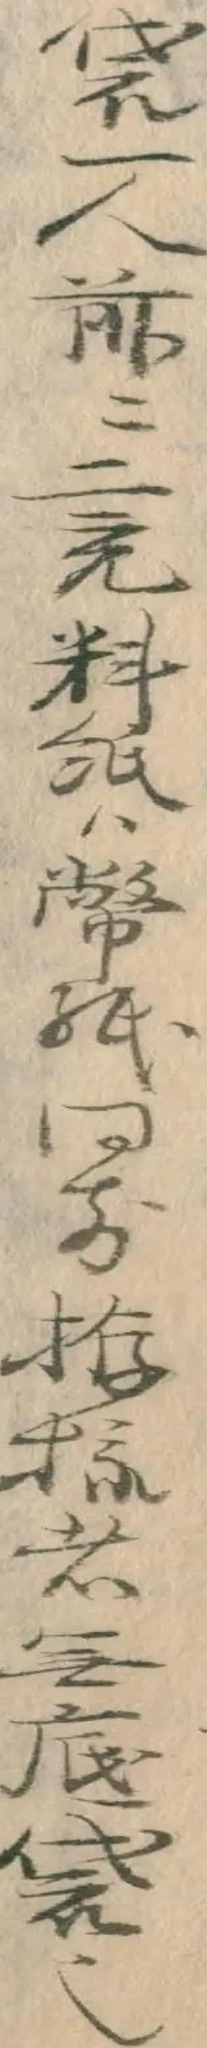袋一人前ニ二充料紙ハ幣紙同前拵様者無底袋也
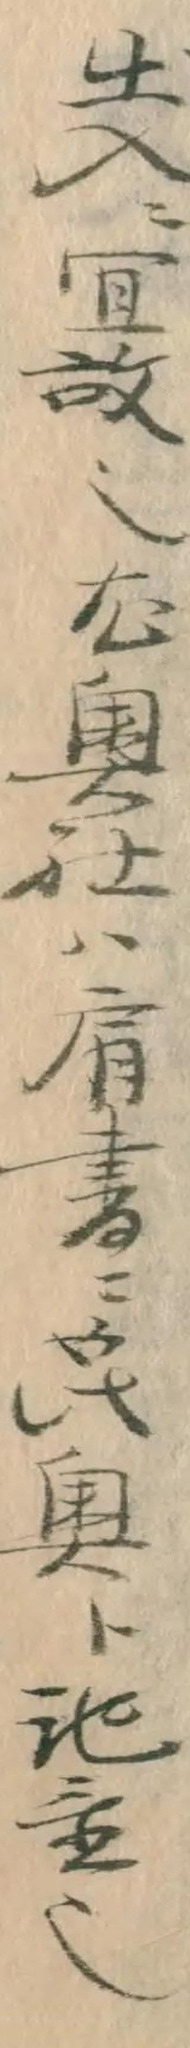出入ニ宜故也尤奥社ハ肩書ニ如此奥ト記置也

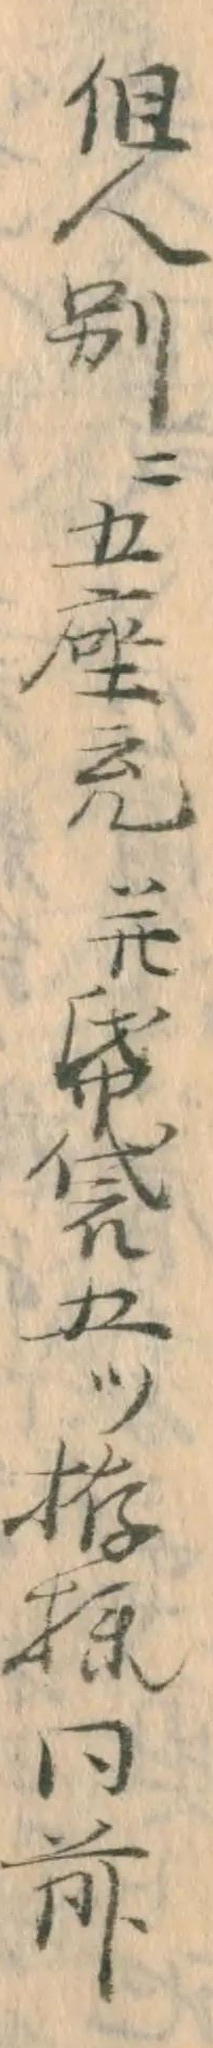但人別ニ五座充并紙袋五ツ拵様同前
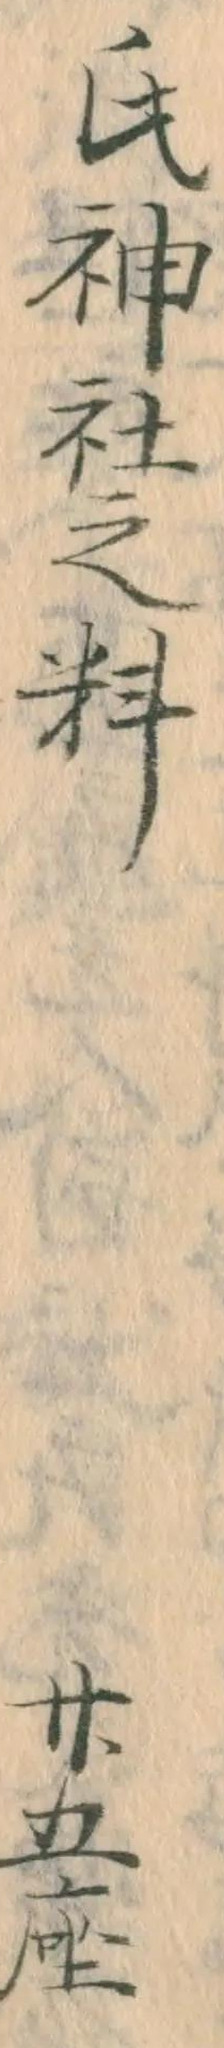氏神社之料廿五座
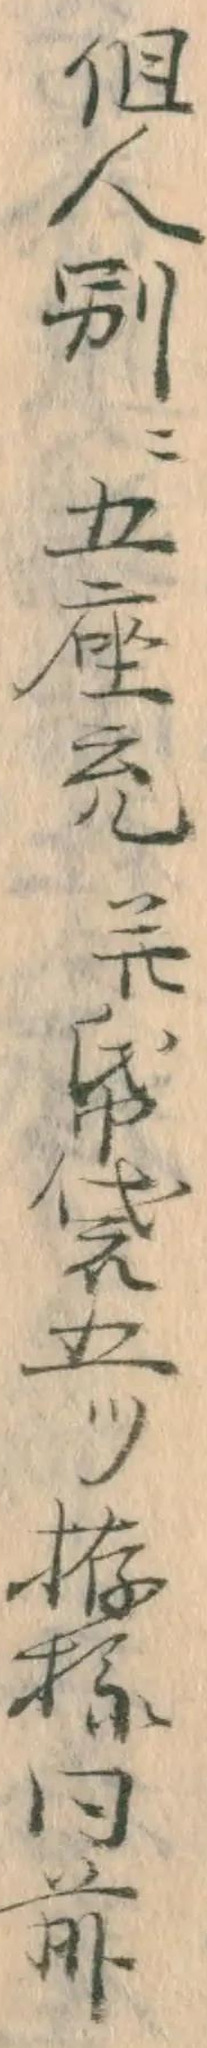但人別ニ五座充并紙袋五ツ拵様同前
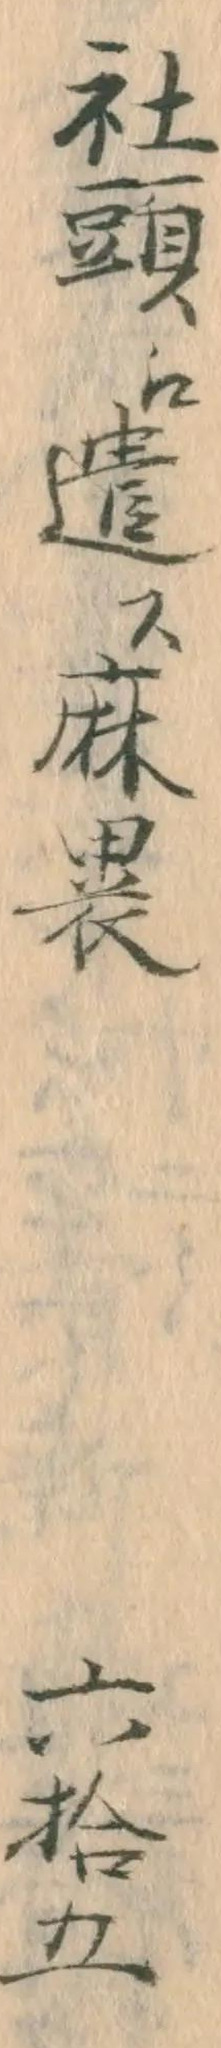社頭え遣ス麻嚢六拾五
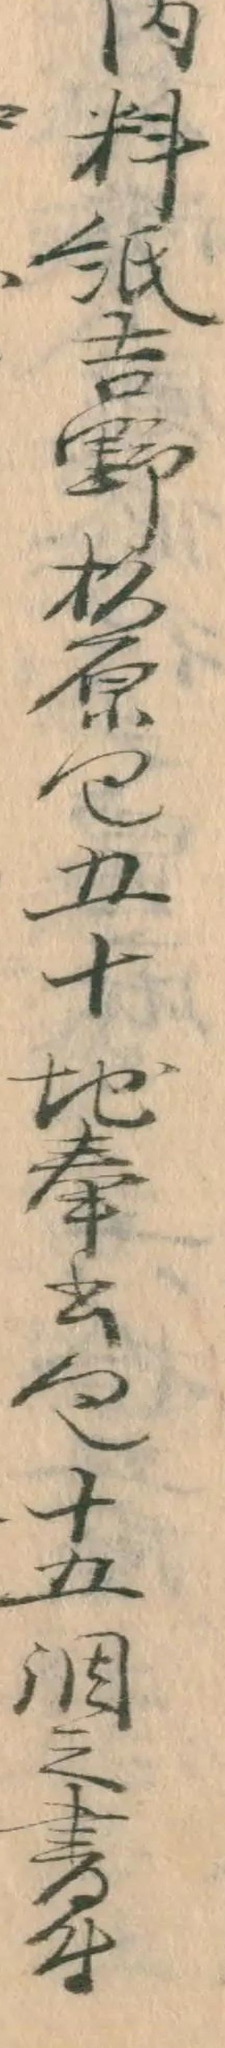内料紙吉野杦原包五十地奉書包十五調之書付
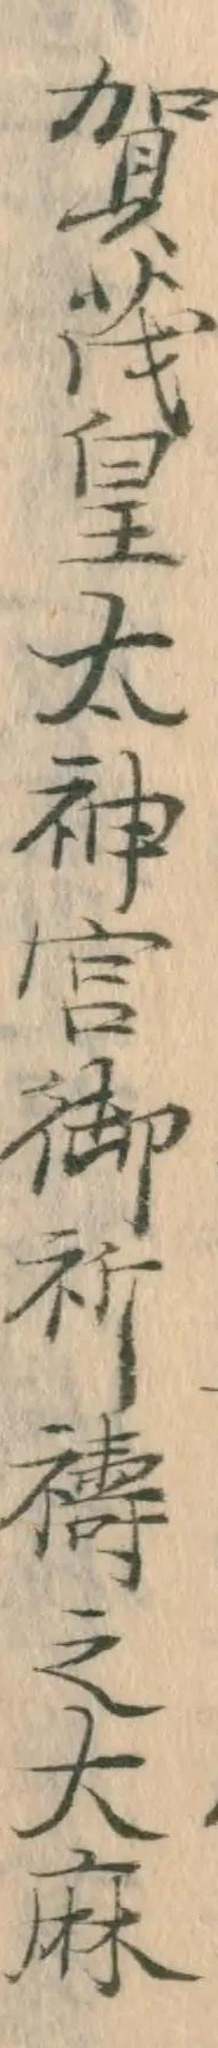賀茂皇太神宮御祈祷之大麻
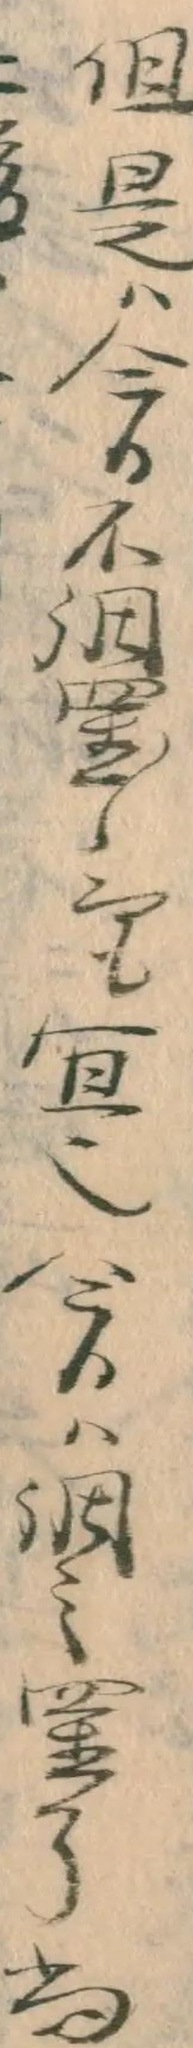但是ハ今日不調置候而も宜也今日ハ調之置終了當
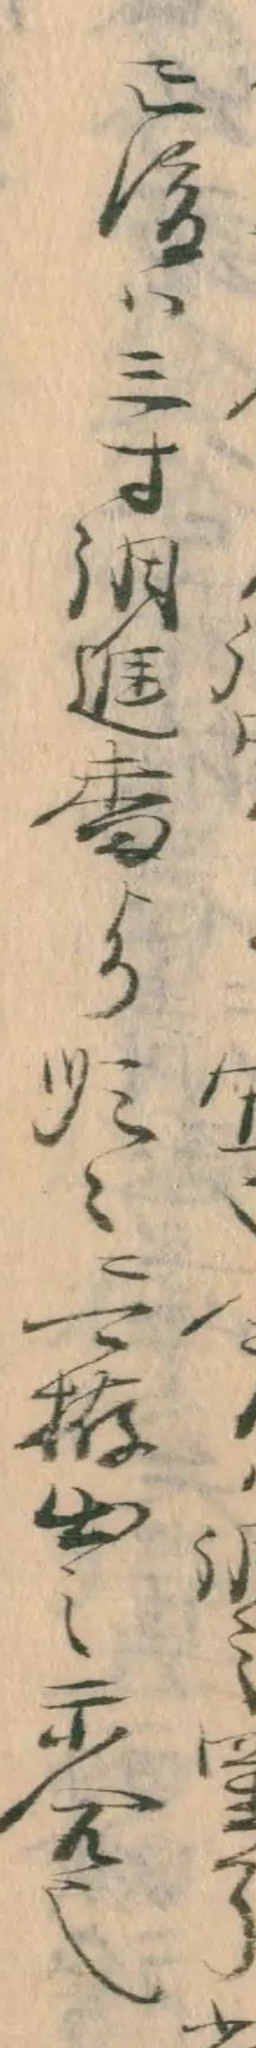已後ハ三寸調進番より順々ニ可拵出之示合也
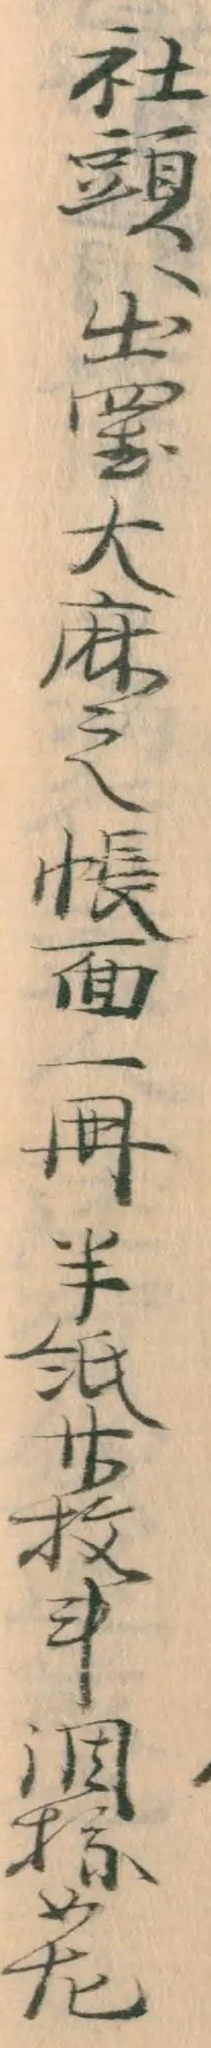社頭へ出置大麻之帳面一冊半紙廿枚斗調様如左
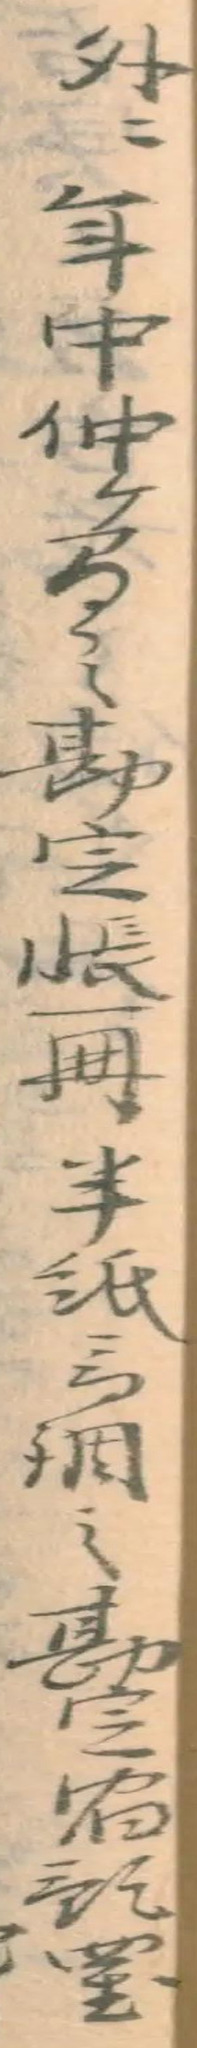外ニ年中仲ヶ間之勘定帳一冊半紙ニ而調之勘定宿預置事
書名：賀茂社記録. 第72冊
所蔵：国立国会図書館 National Diet Library, JAPAN
